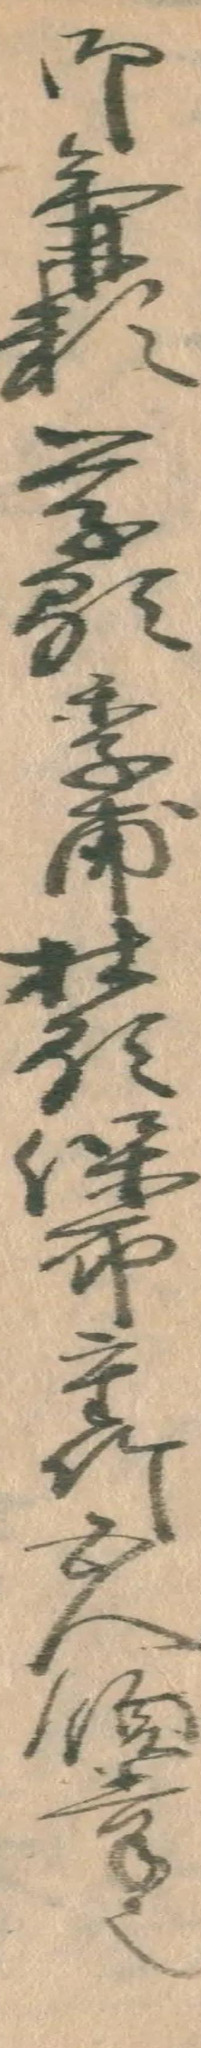御兼頼学顕季甫杜顕保布重竹五人領掌也
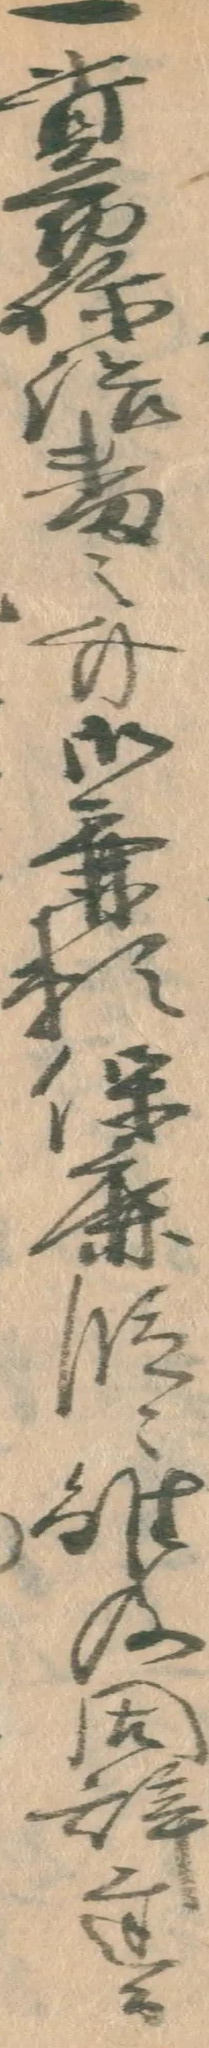一貴布祢詰番之介御兼頼保鹿段々雖及固辞達而
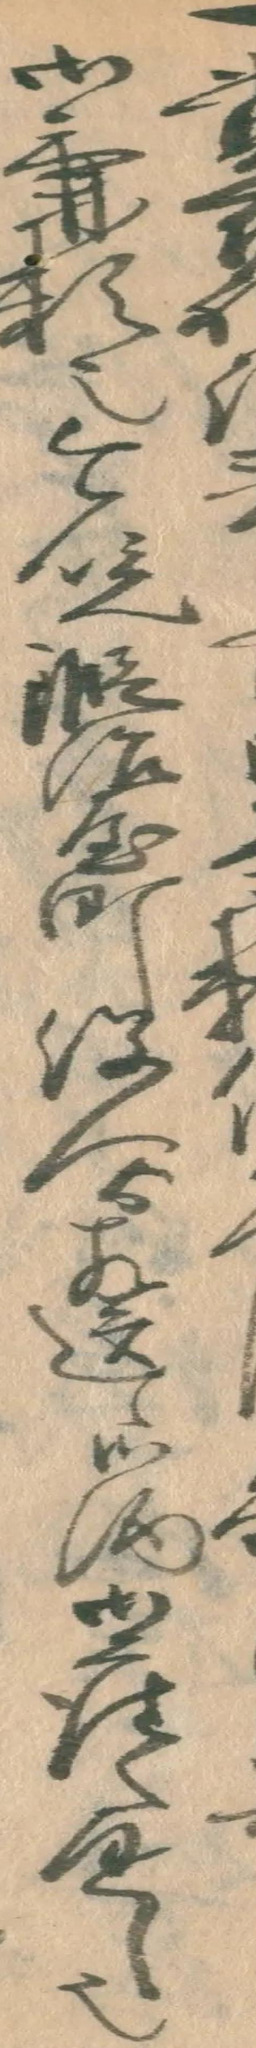御兼頼也今晩鍛冶屋町役人ゟ相送候御酒御座へ通し也
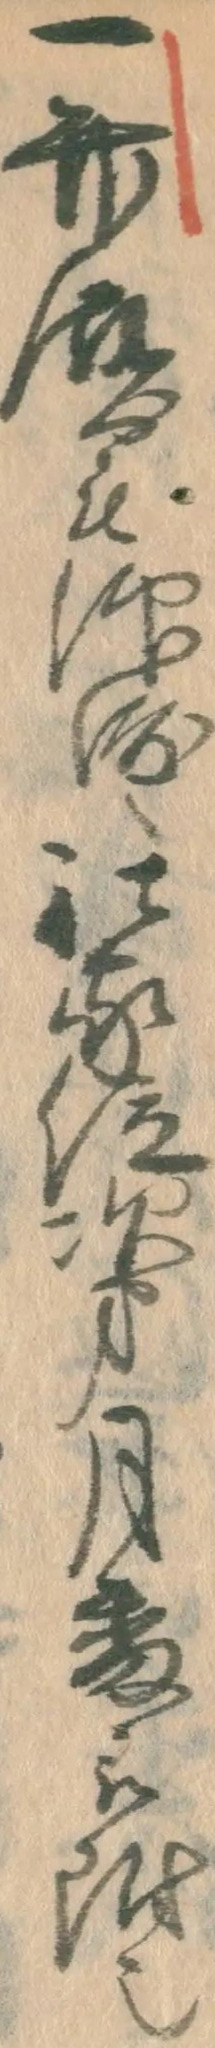一弁殿ゟ被仰渡候社家位次第月番被付也
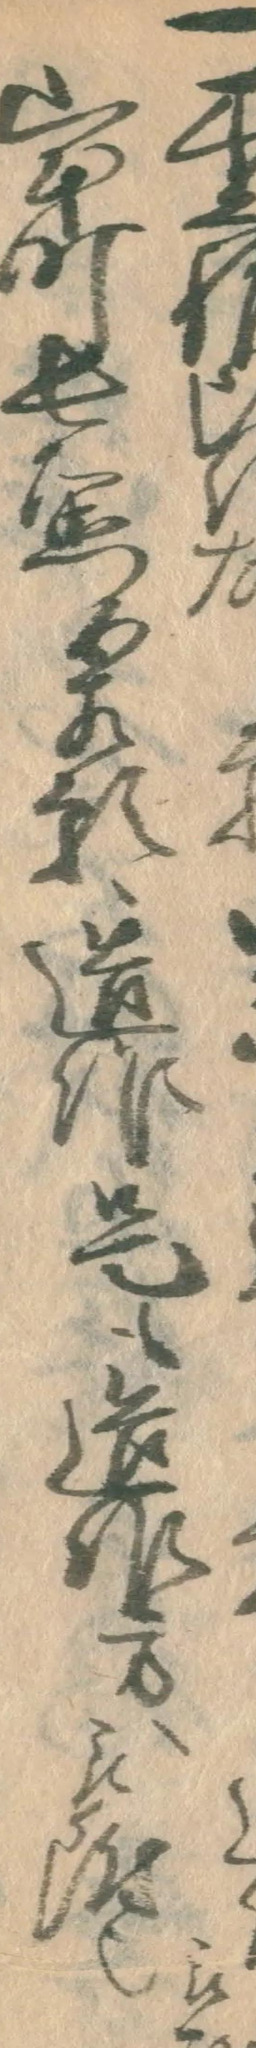山本町長右衛門ゟ相願候造作是も造作方へ被付也
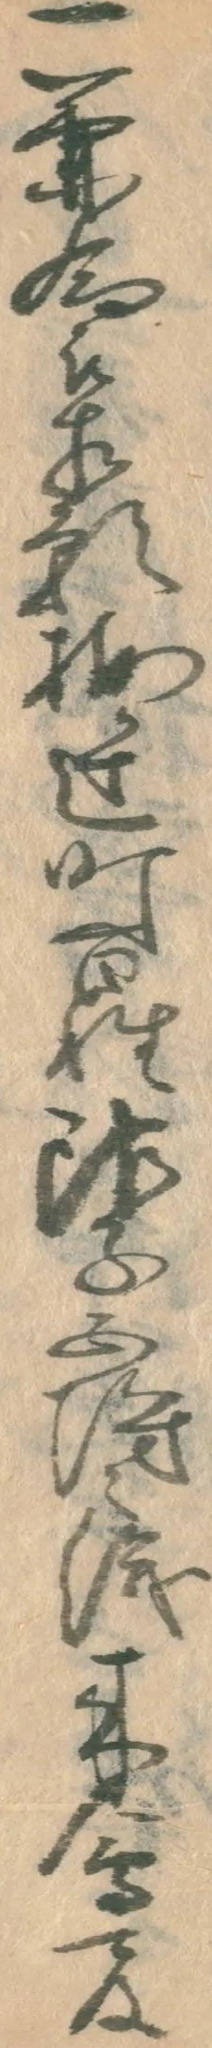一兼為被相願梅か辻町百姓銀子不埒之儀来会可及
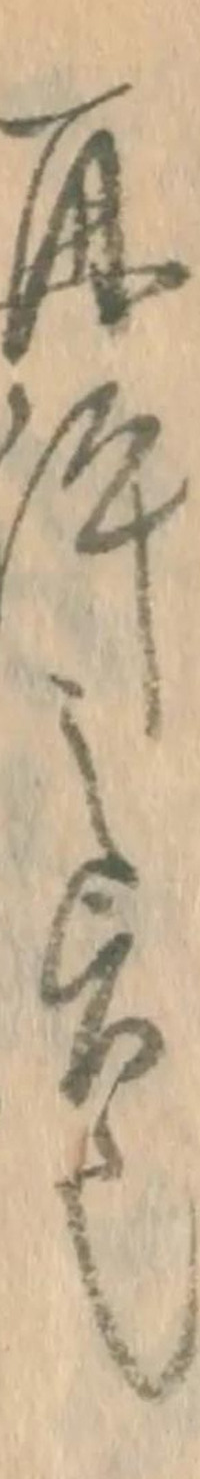再評之旨也
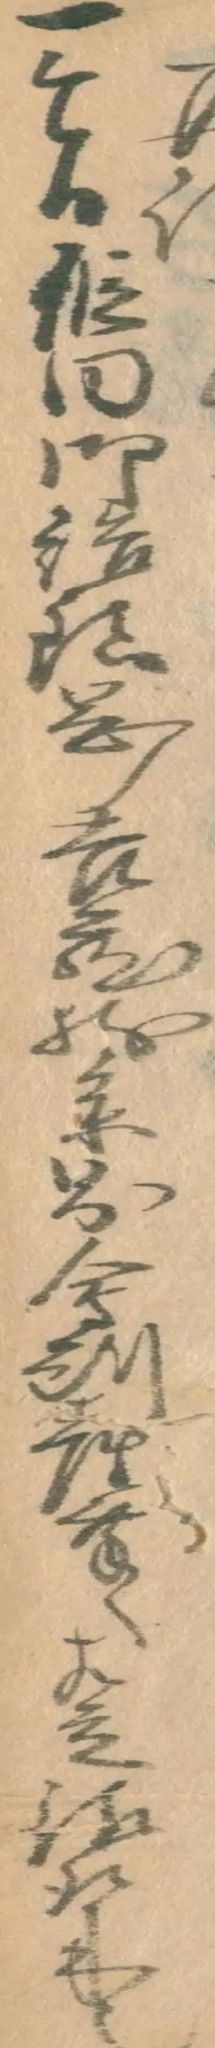一今日御結鎮岡ノ吉蔵持参則会所産幸へ相立請取来也

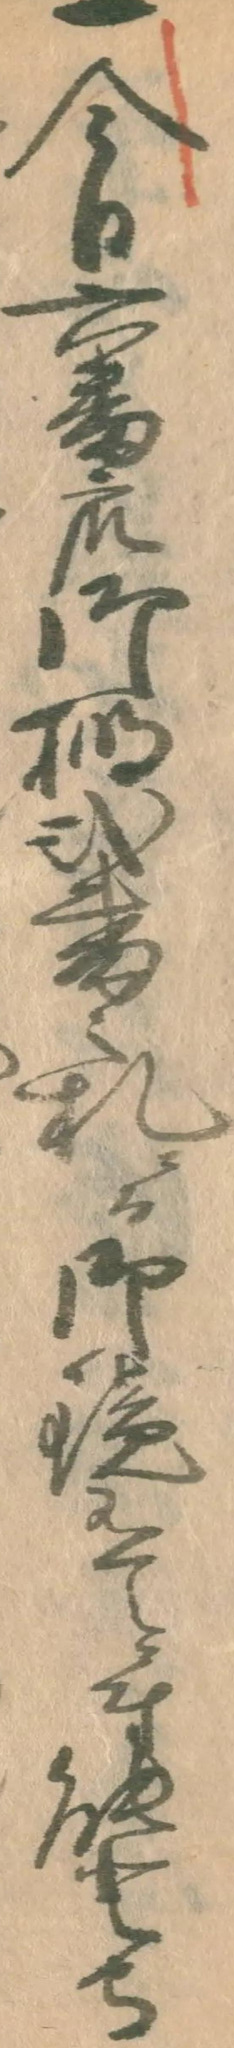一今日六番衆御棚弐番之札ニ而御鏡有之ニ付能登守
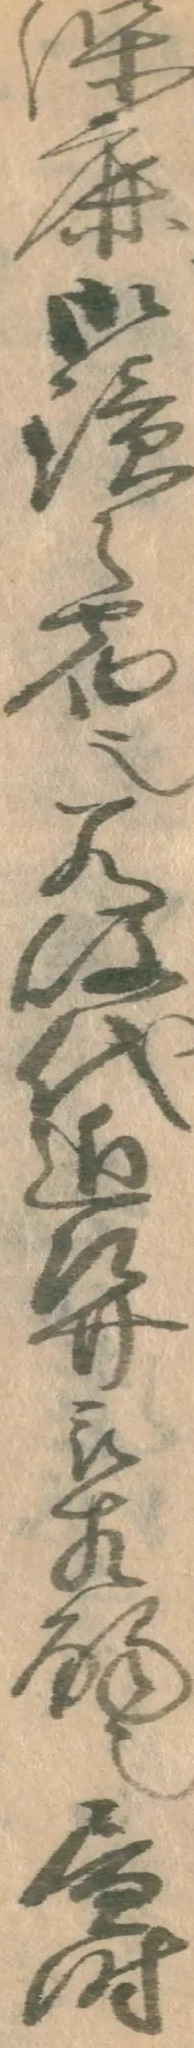保鹿御鏡之宿也若役代近江介被相触也昼時
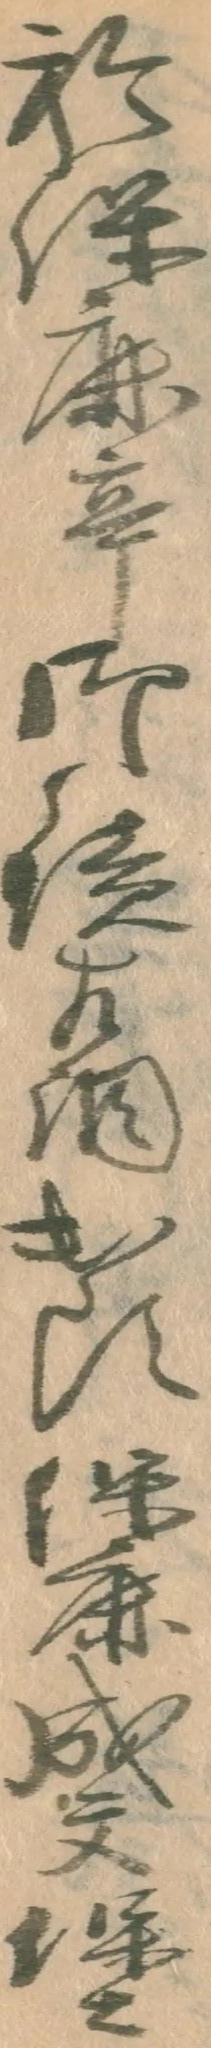於保鹿亭御鏡相調出頭保鹿成文保土
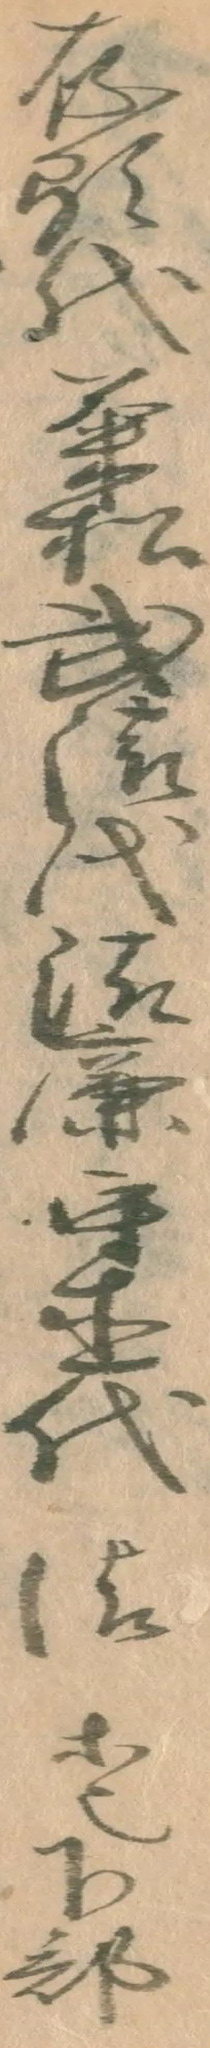存顕代菊松武清代清廉守直代清等也下部
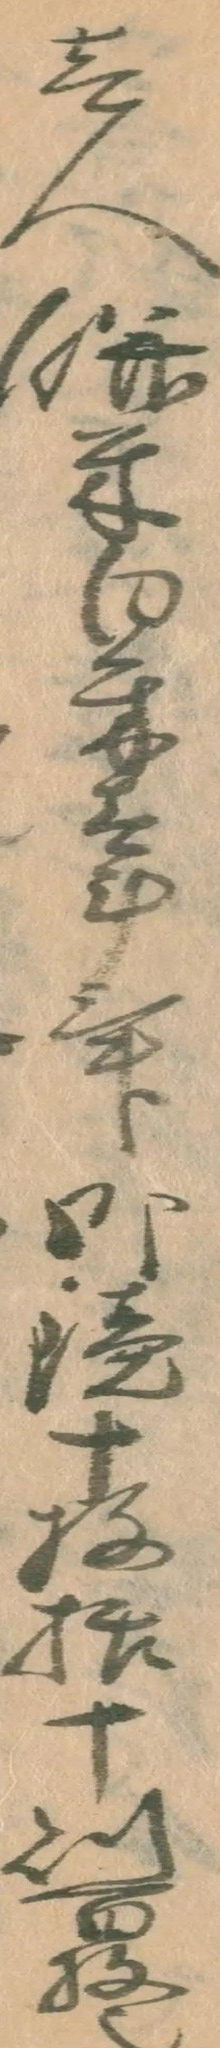壱人餅米白米壱斗三升御鏡十枚括十列百枚也
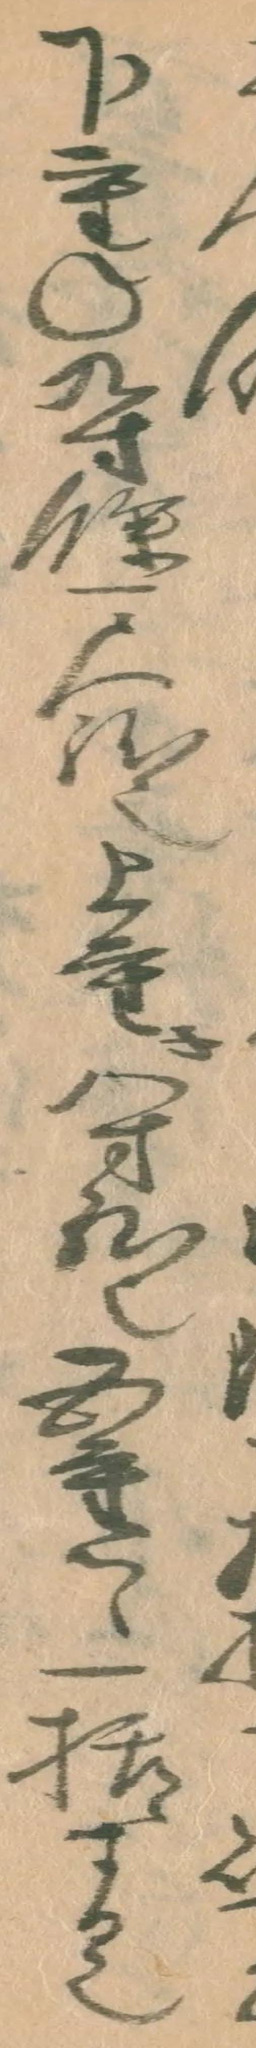下重ね九寸余一尺程也上重ネ八寸程也五重ツヽ一括ニする也
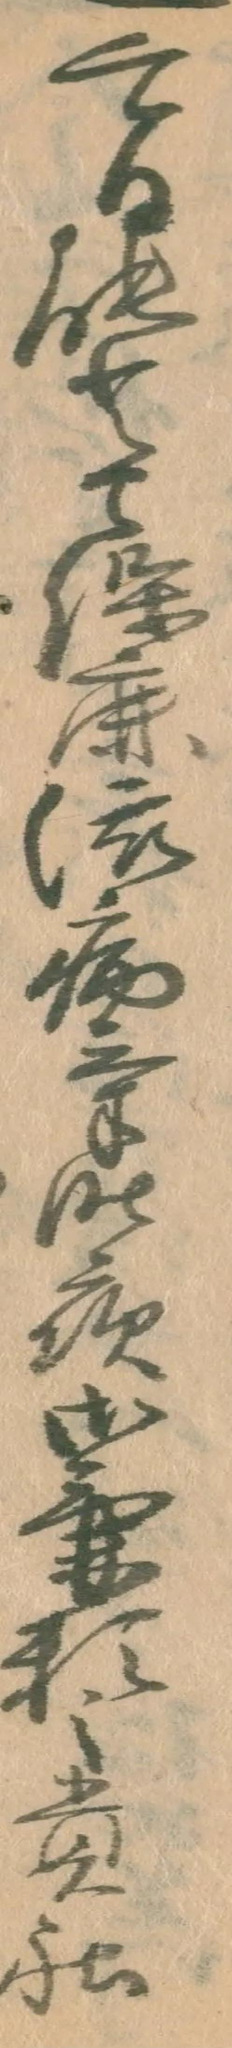一今日能登守保鹿依病気昨夜御兼頼之貴社
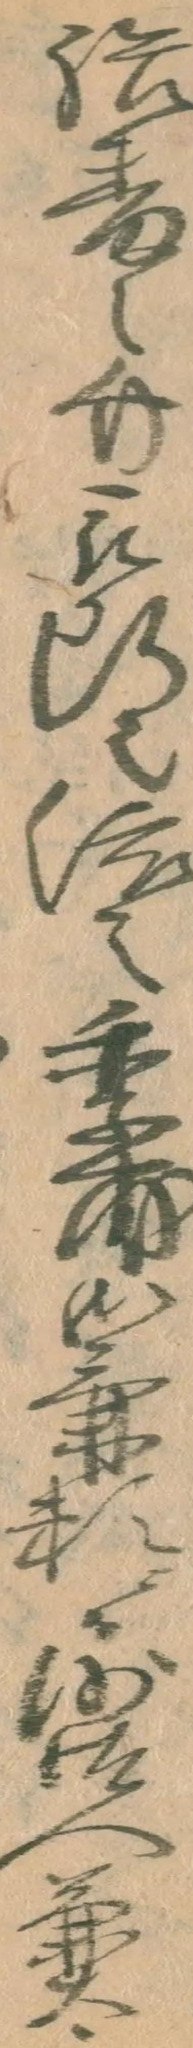詰番之介被断也依之季甫御兼頼ニ而沙汰人兼太
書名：賀茂社記録. 第60冊
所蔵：国立国会図書館 National Diet Library, JAPAN
